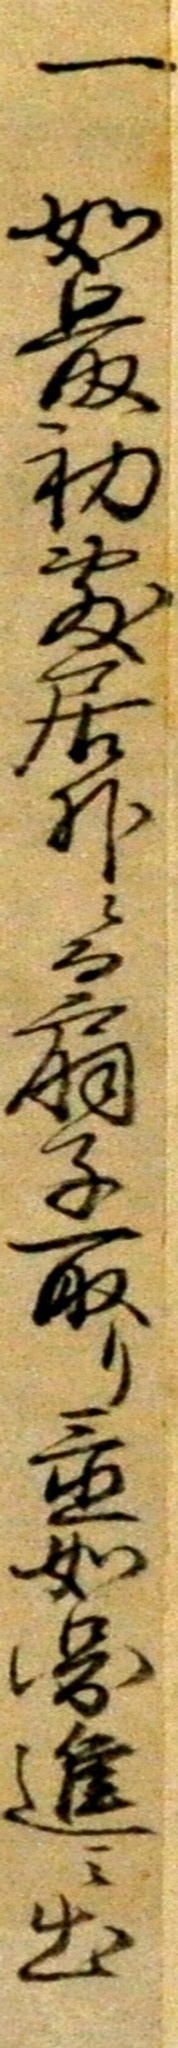一如最初敷居外ニ而扇子取り置如図進ミ出
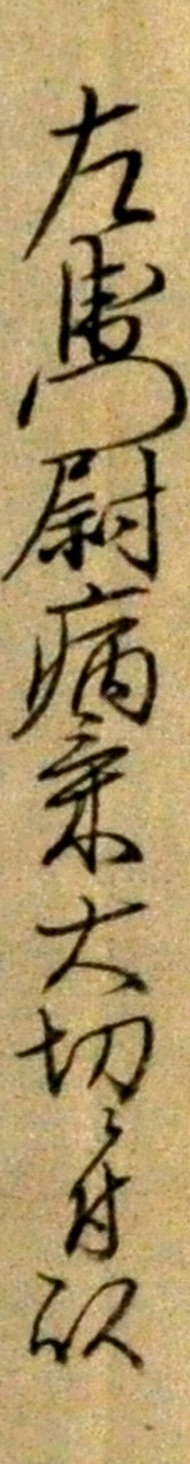左衛門尉病気大切ニ付以
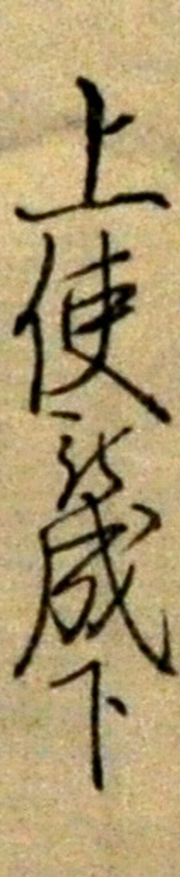上使被成下
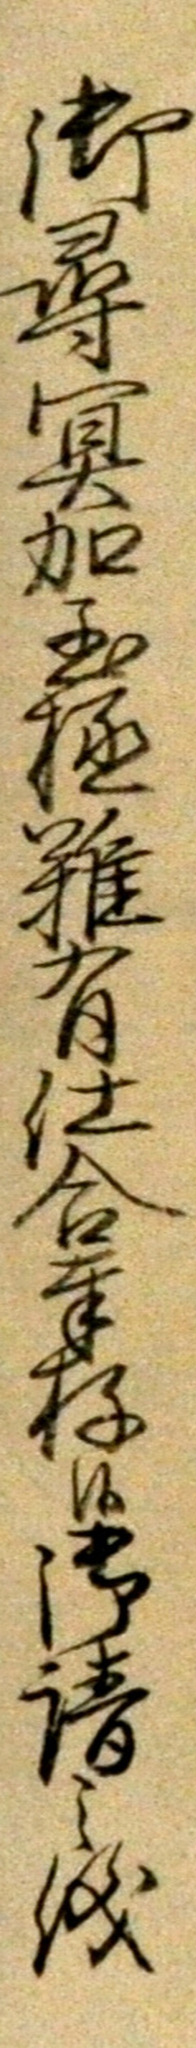御尋冥加至極難有仕合奉存候御請之儀
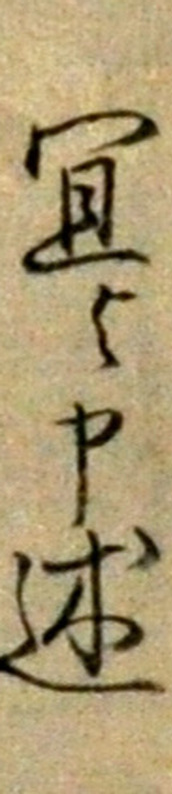宜と申述
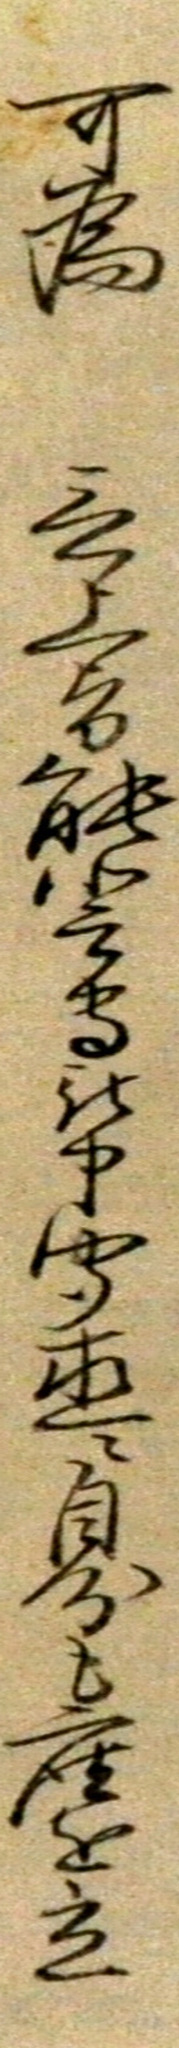可為言上旨能登守被申聞直ニ自分も座を立
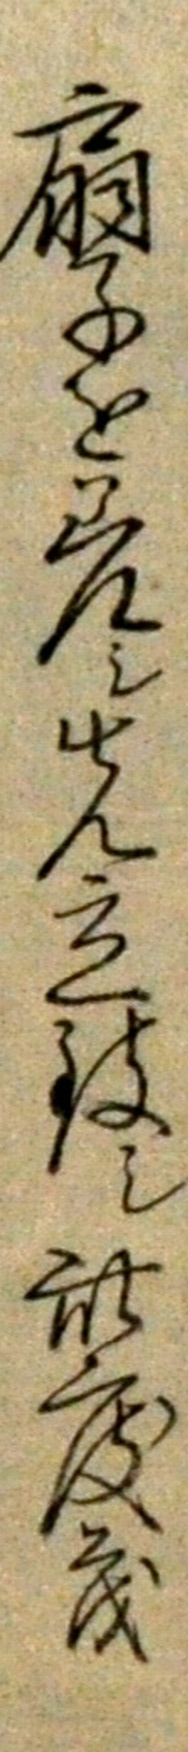扇子を差シ先立致シ此度も
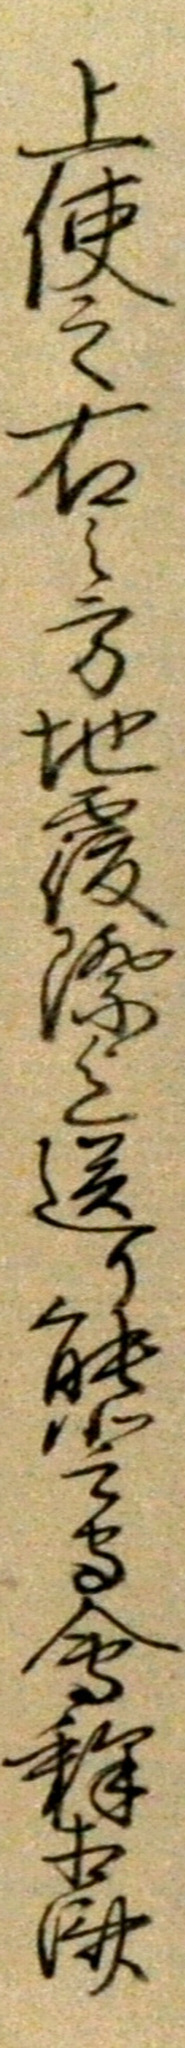上使之右之方地覆際迄送り能登守会釈相済

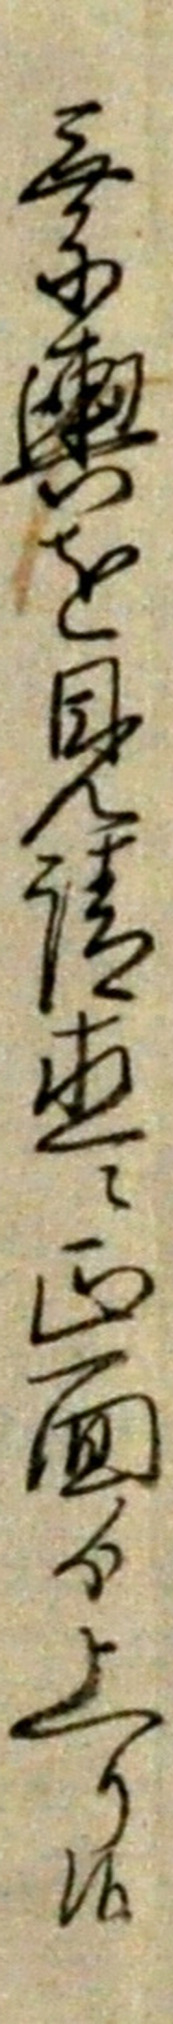乗輿を見請直ニ正面ゟ上り候
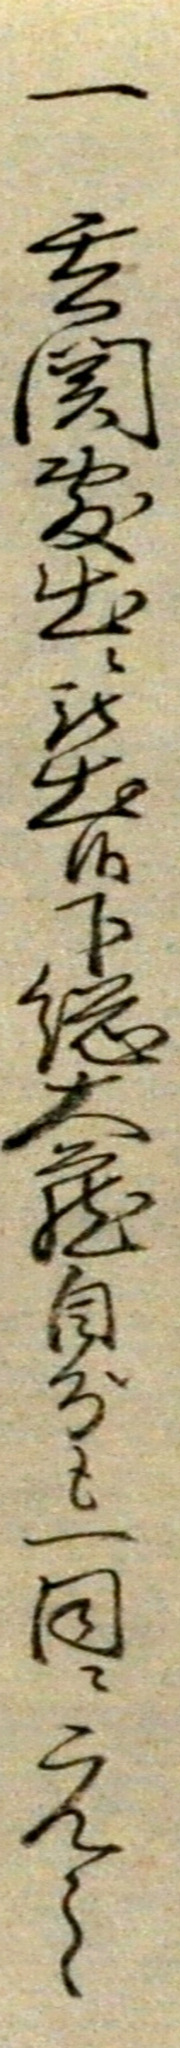一玄関敷出ニ被出候下総大蔵自分も一同ニ元之
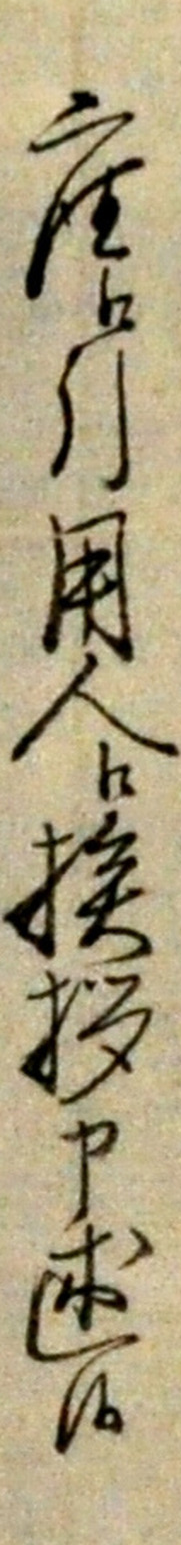座え引用人え挨拶申述候
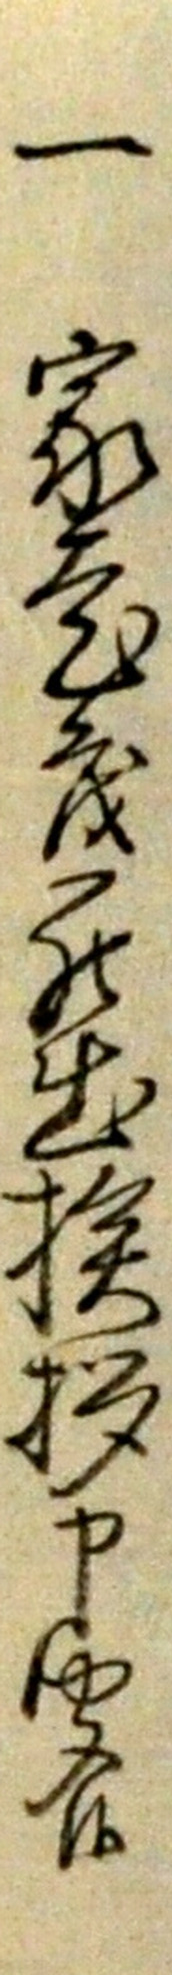一家老も罷出挨拶申聞候
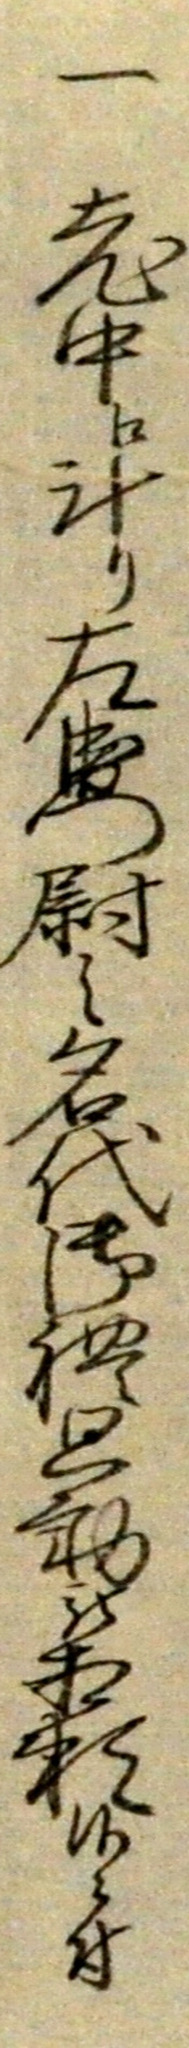一老中え計り左衛門尉之名代御礼廻勤被相頼候ニ付
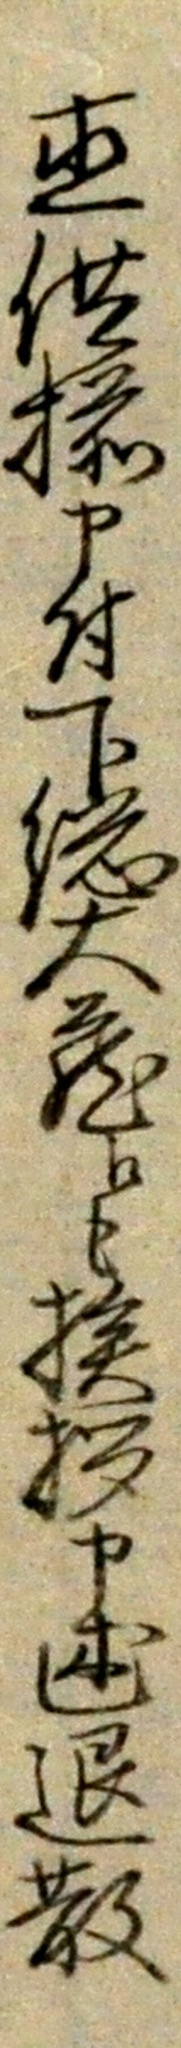直供揃申付下総大蔵えも挨拶申述退散
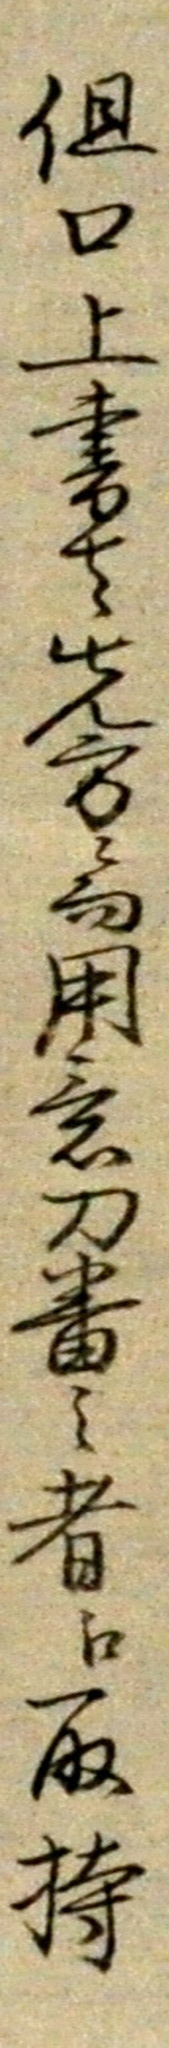但口上書は先方ニ而用意刀番之者え取持
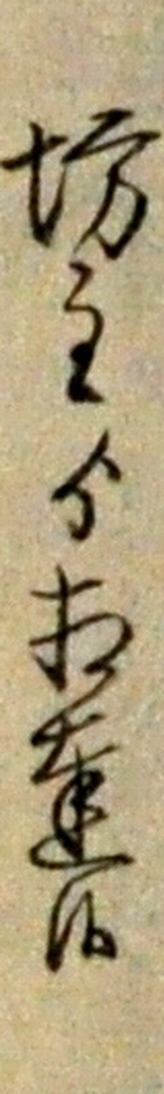坊主ゟ相達候
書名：上使仰付ラレ候節ノ留外
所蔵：伊那市立高遠町図書館・合同会社AMANE
